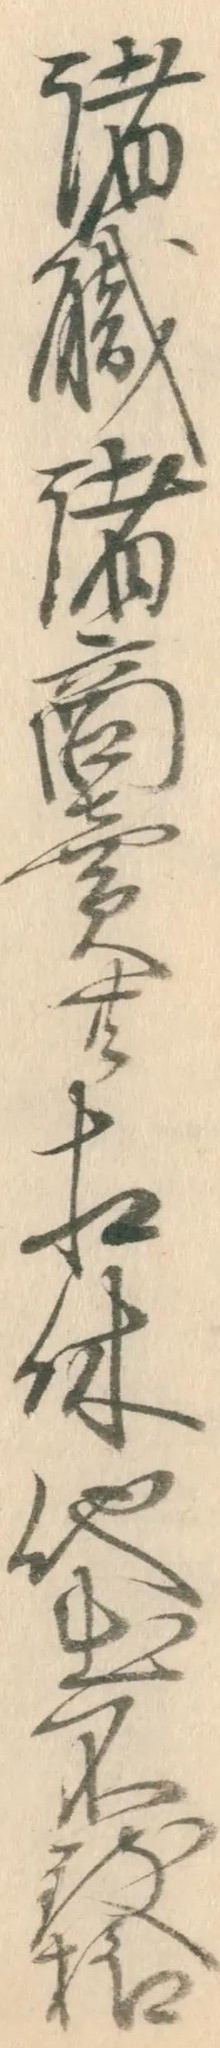諸職諸商売共相休他出不致様
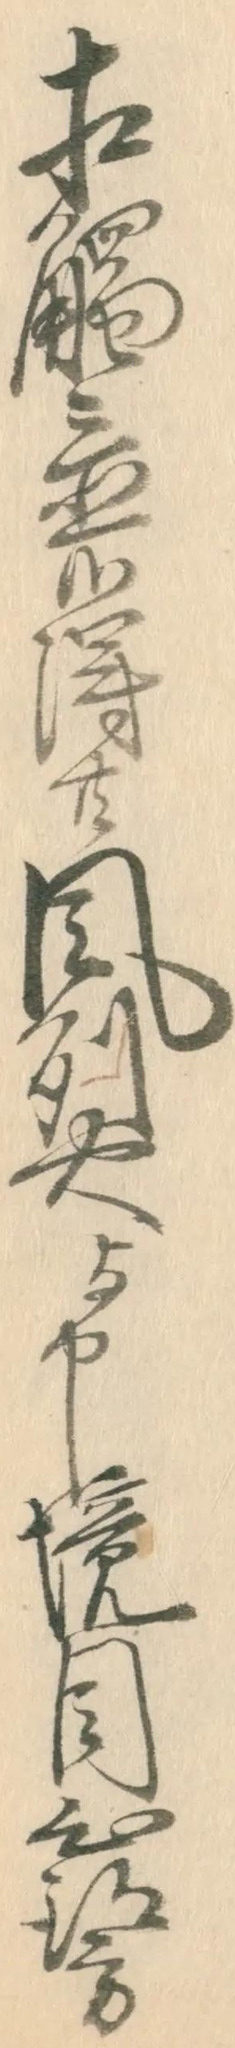相触置候得共風烈と申境目心得方

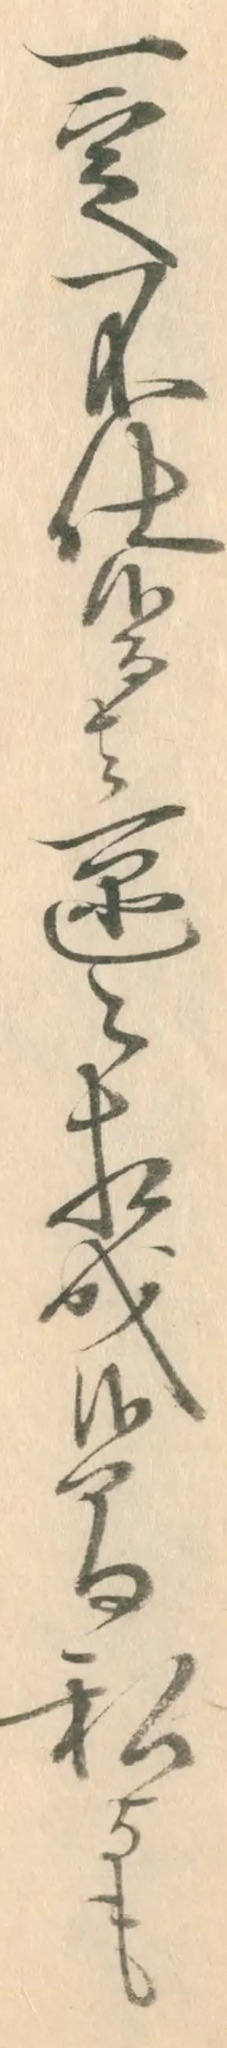一定不仕候而は区々相成候間私とも
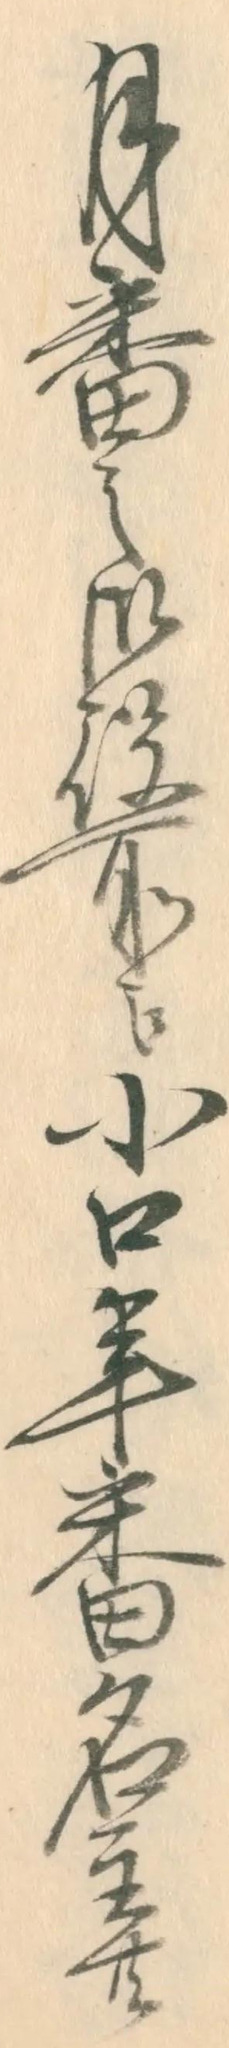月番之御役所え小口年番名主共
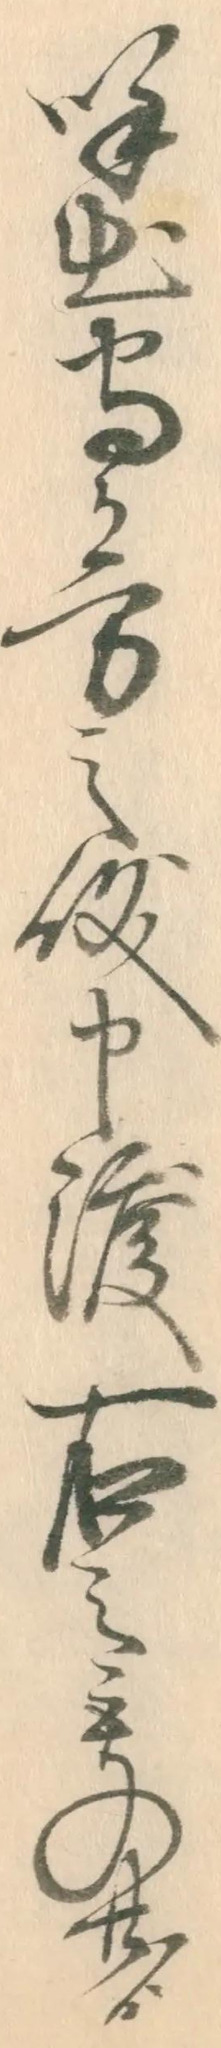呼出守り方之儀申渡右之もの共ゟ
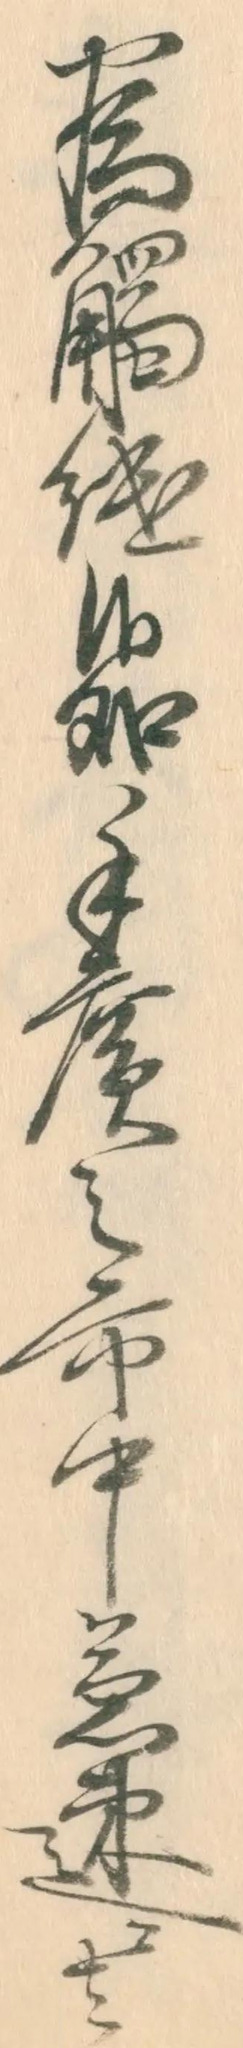為触継候処手広之市中急速ニは
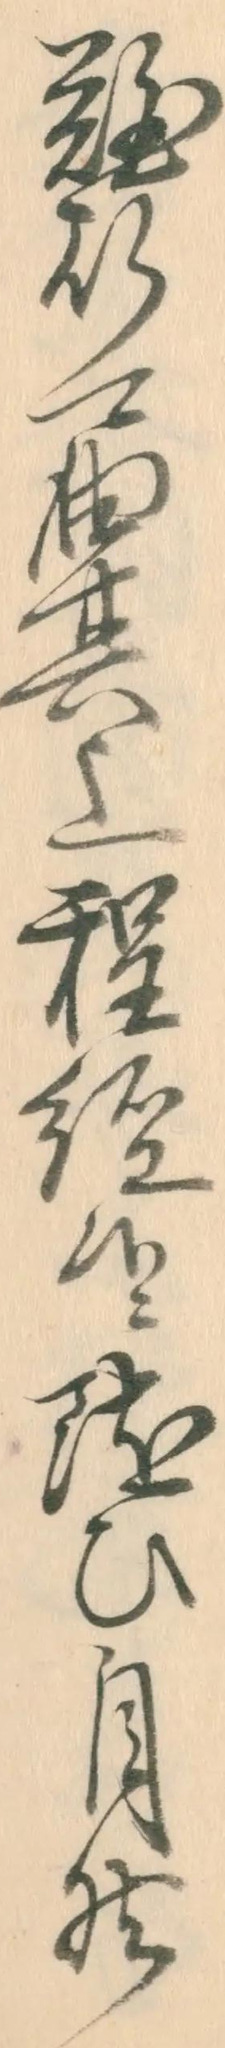難行届其上程経候ニ随ひ自然
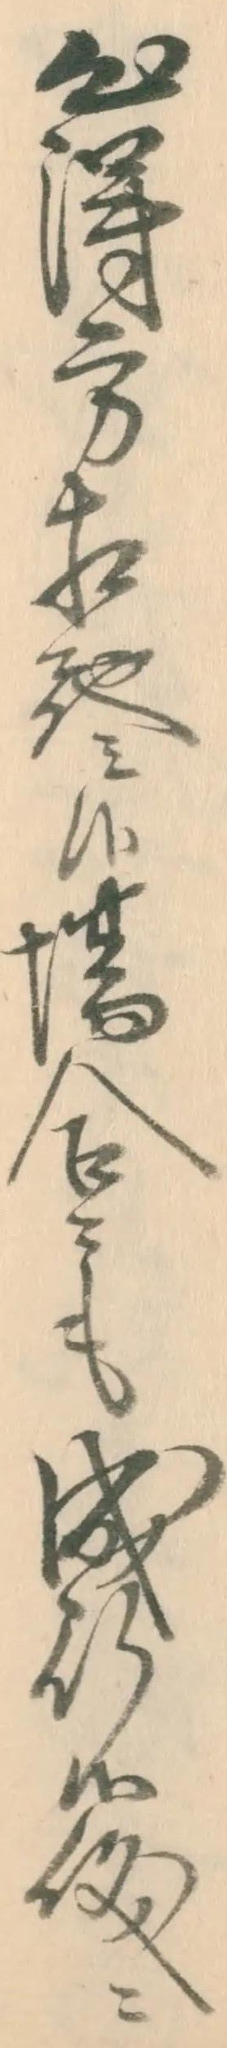心得方相弛ミ候場合ニも成行候儀ニ
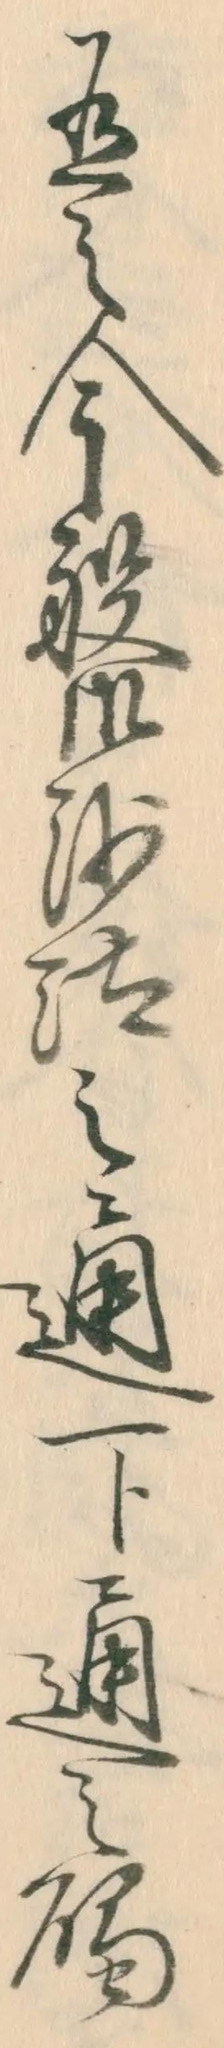有之今般御沙汰之通一ト通之触
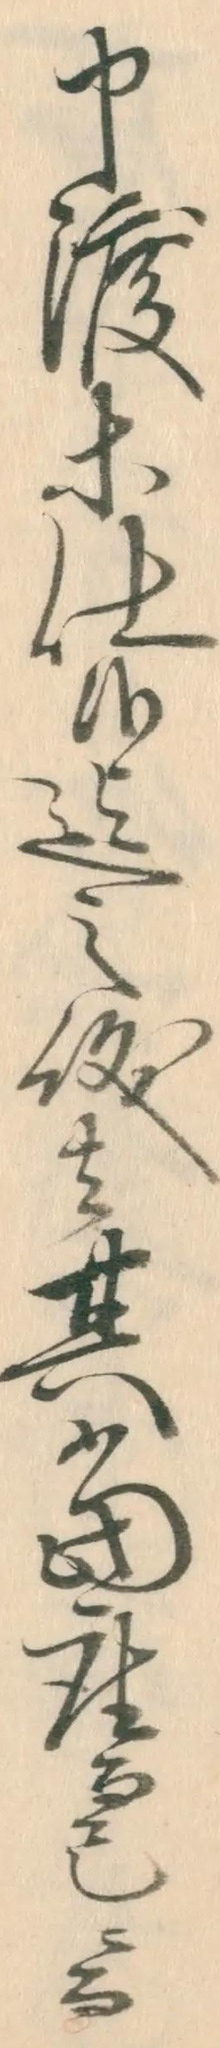申渡等仕候迄之儀は其当座而已ニ而
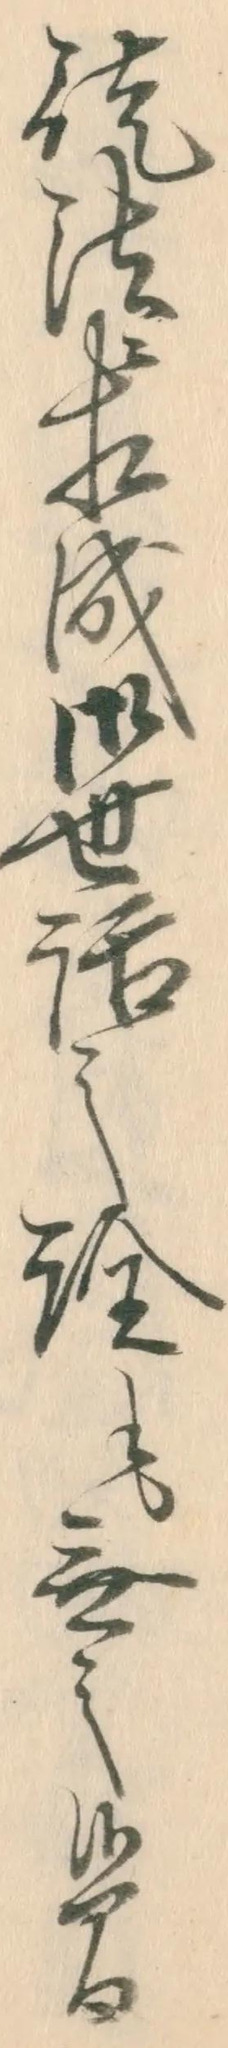徒法ニ相成御世話之詮も無之候間
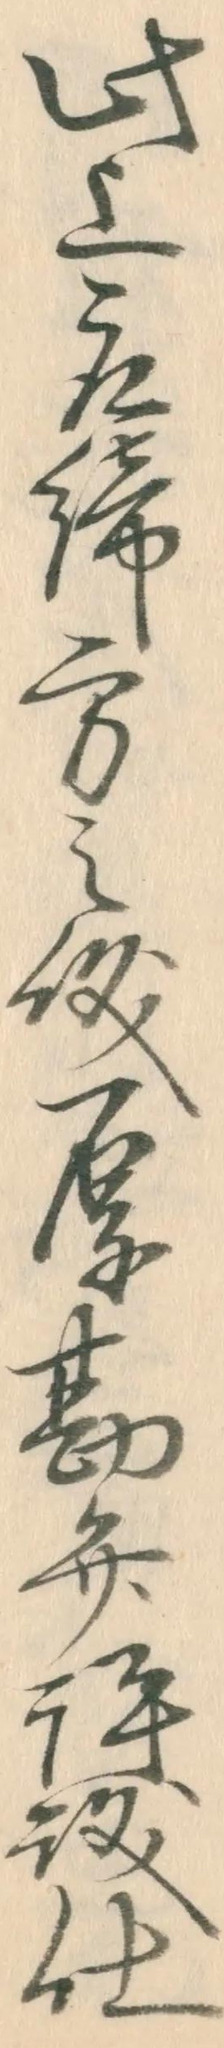此上取締方之儀厚勘弁評議仕
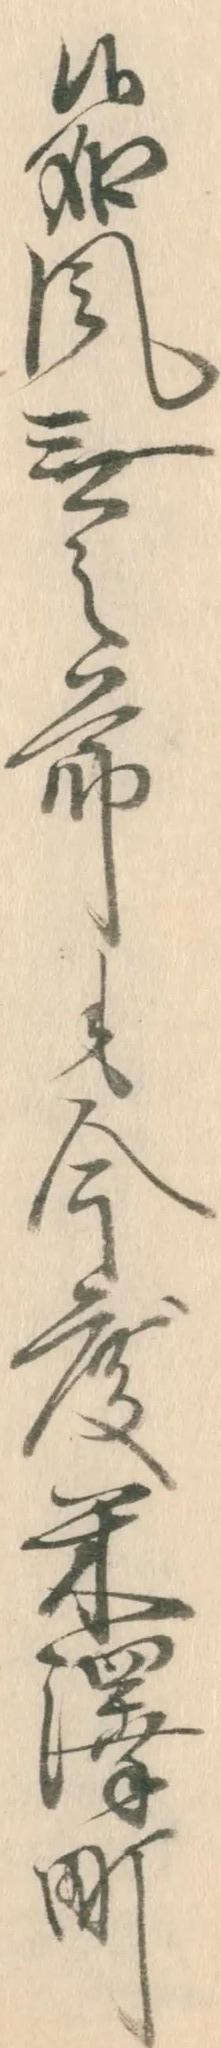候処風無之節も今度米沢町
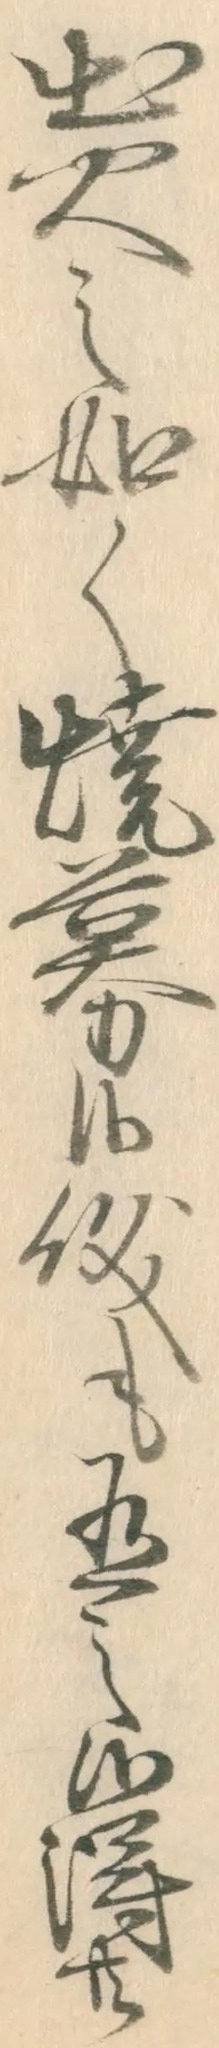出火之如く焼募候儀も有之候得共

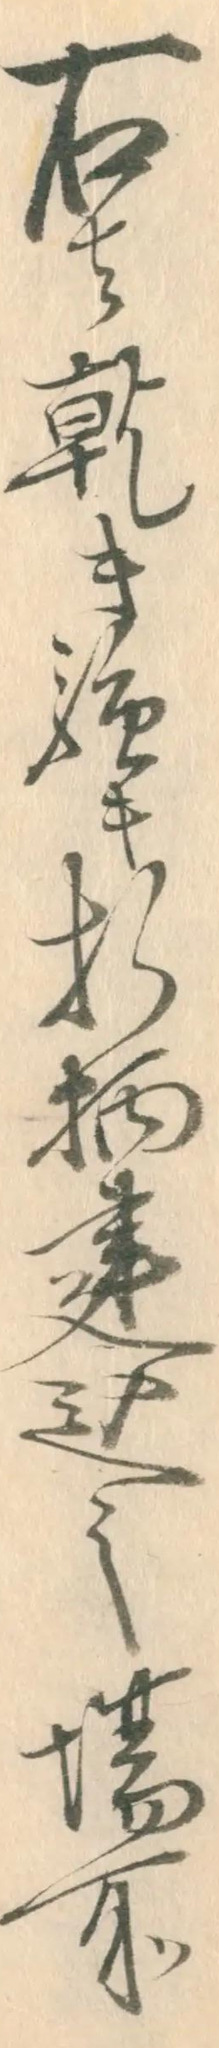右は乾き軽キ折柄建込之場所
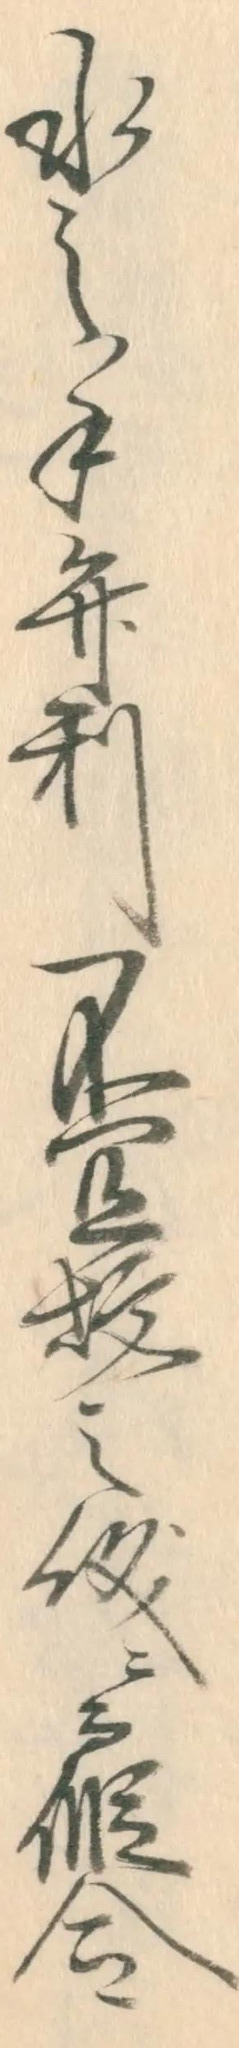水之手弁利不宜故之儀ニ而仮令
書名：三橋 17巻. [7] 三橋小破御修復書留　但御奉行御掛リ替地震潰橋番屋　嘉永四亥年より安政二卯年迄　上
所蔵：国立国会図書館 National Diet Library, JAPAN
